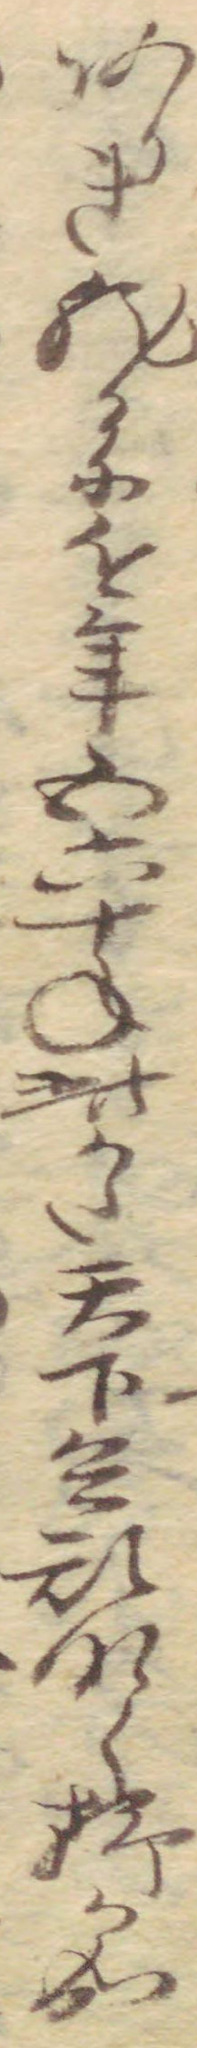ありき然るに近年五六十年此かた天下兵乱なく静成
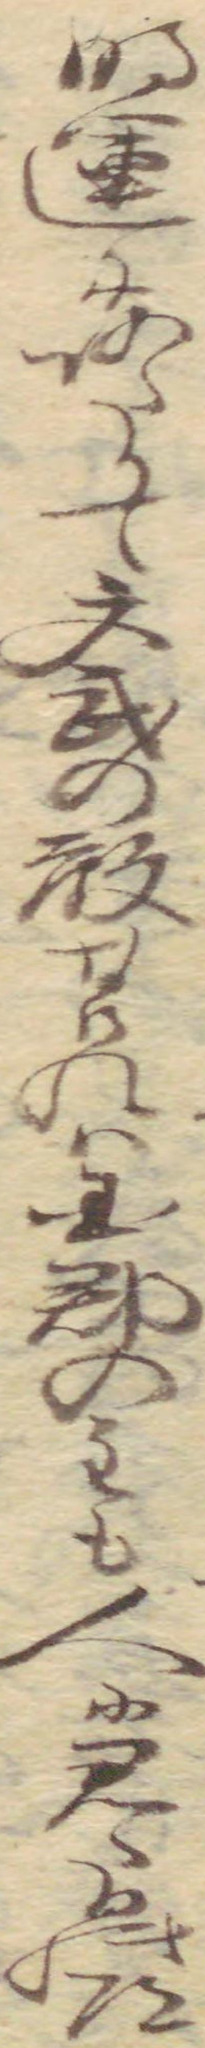時運にあたりて文武の教なけれは国郡の主も人に君たるの道
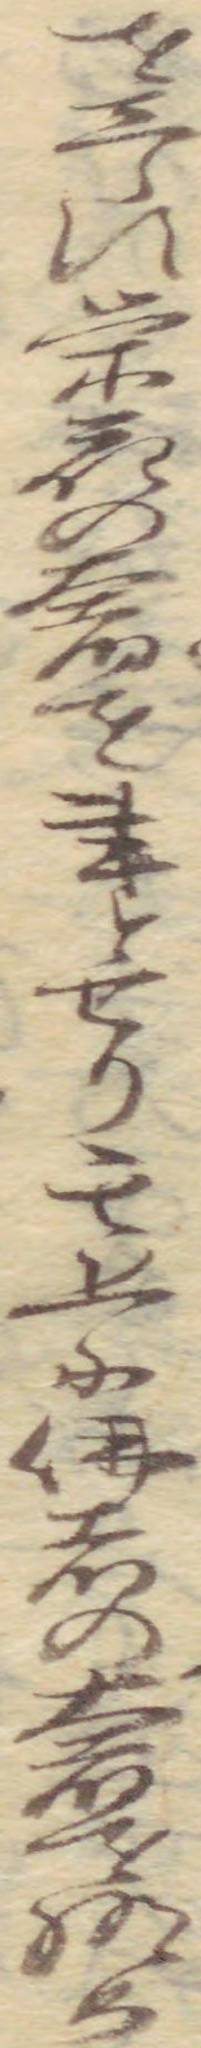をしらす栄花の奢を事とせり其上に仏者の奢を極め
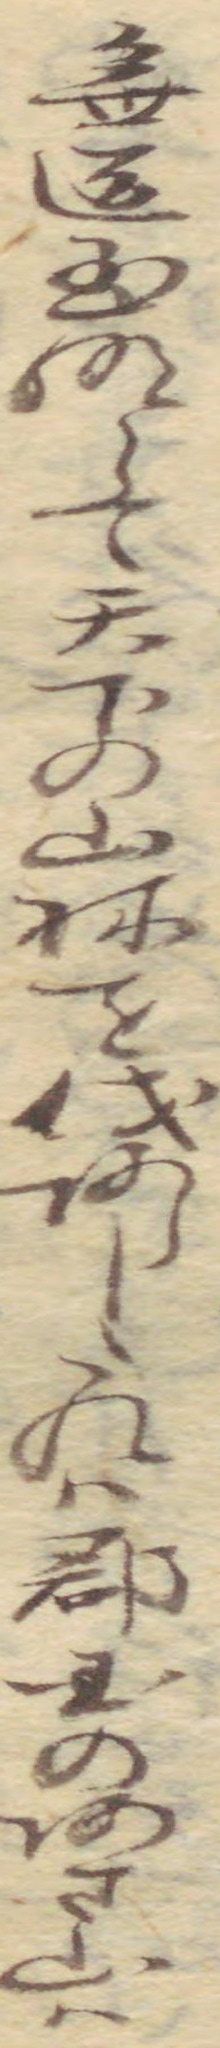無道至極して天下の山林を伐あらしたれは郡国のあさ山は
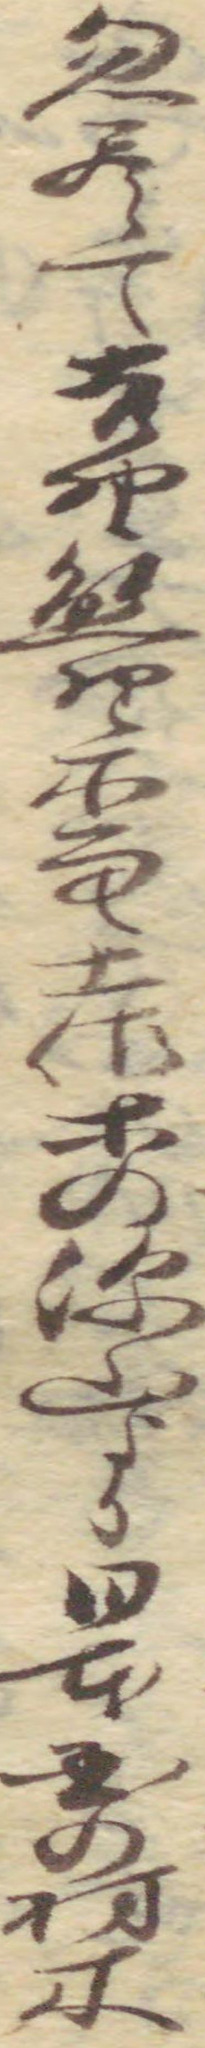忽尽て吉野熊野木曽土佐等の深山より日本国の材木
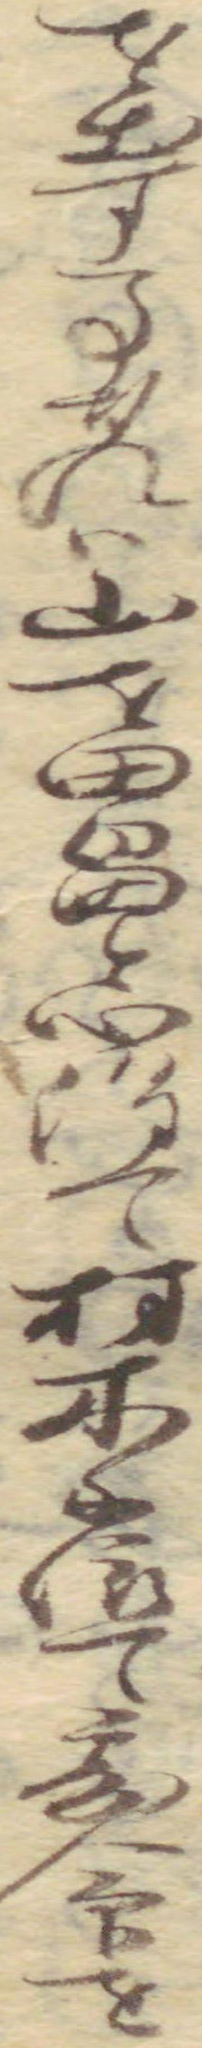を出す事なれは山を田畠と心得て材木に依て露命を
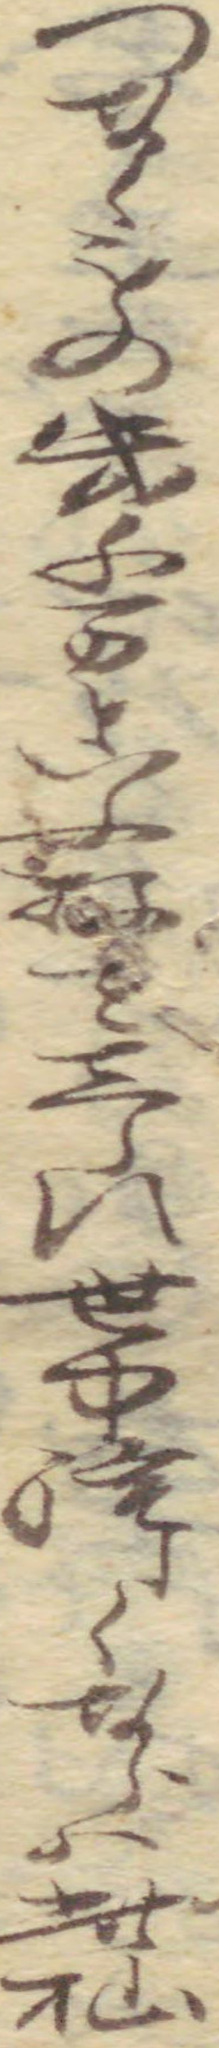つなくもの幾千万といふ数をしらす世中騒しくならは此杣
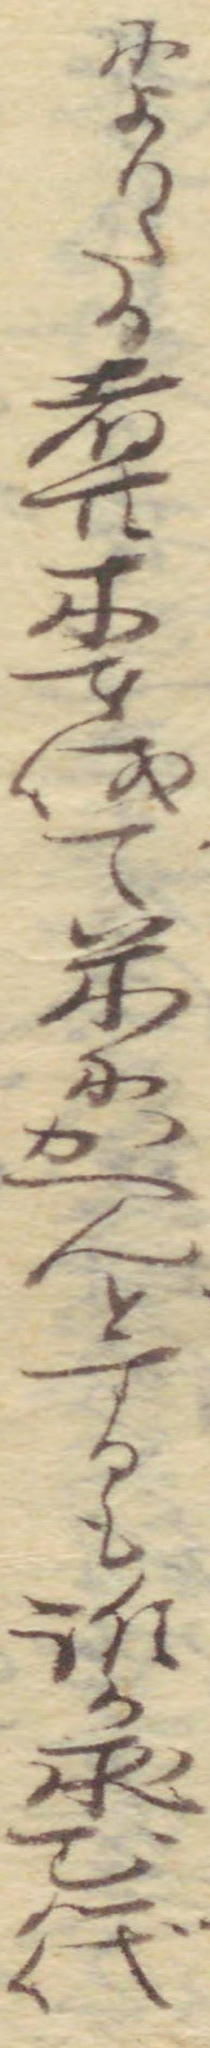によりたる者共木を伐て米にかへんとするも誰か求む筏
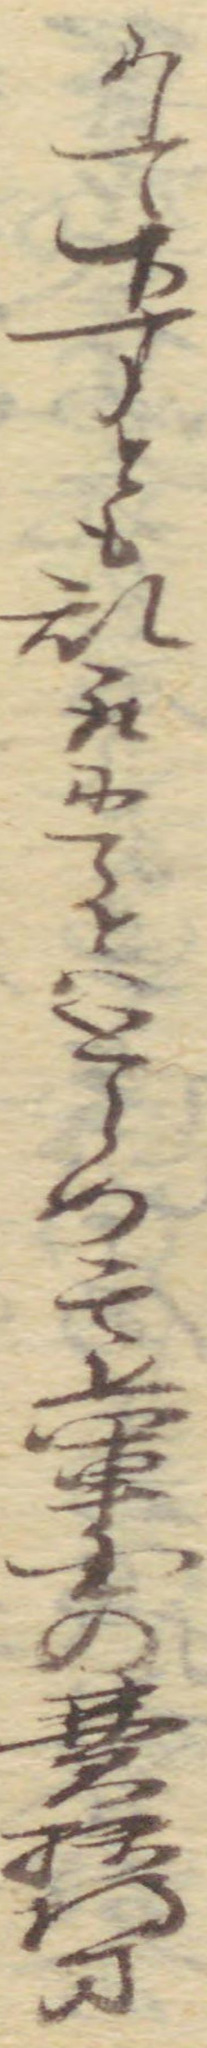にて下すとも乱取にこそはとらめ其上軍国の費扶持方
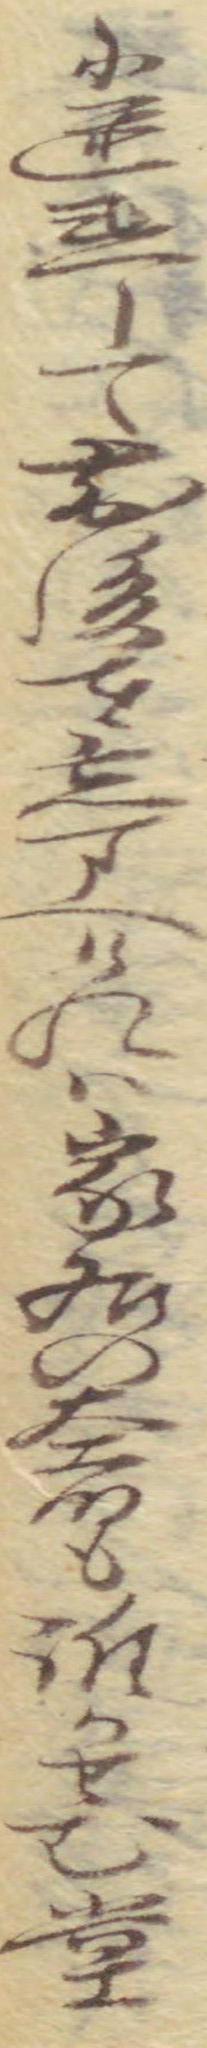に迷惑して前後を忘すへけれは家居の奢も誰かせむ堂
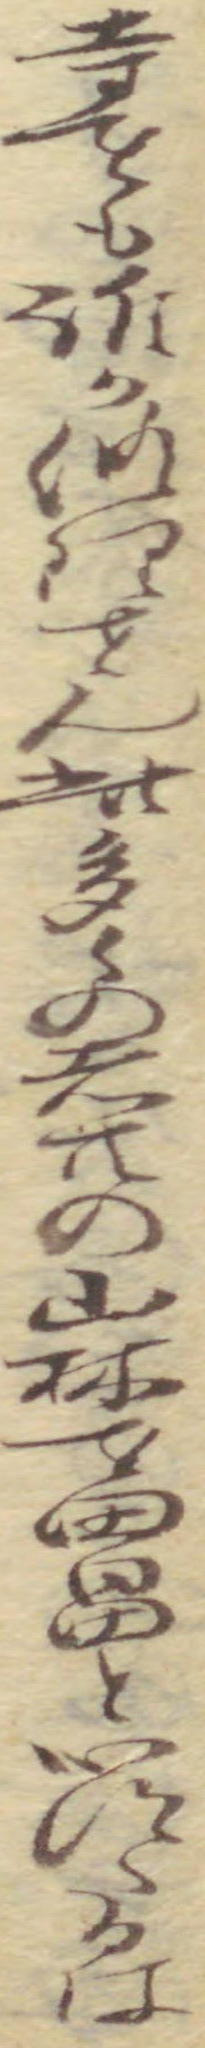寺をも誰か修理せん此多くの者共の山林を田畠と心得たるは
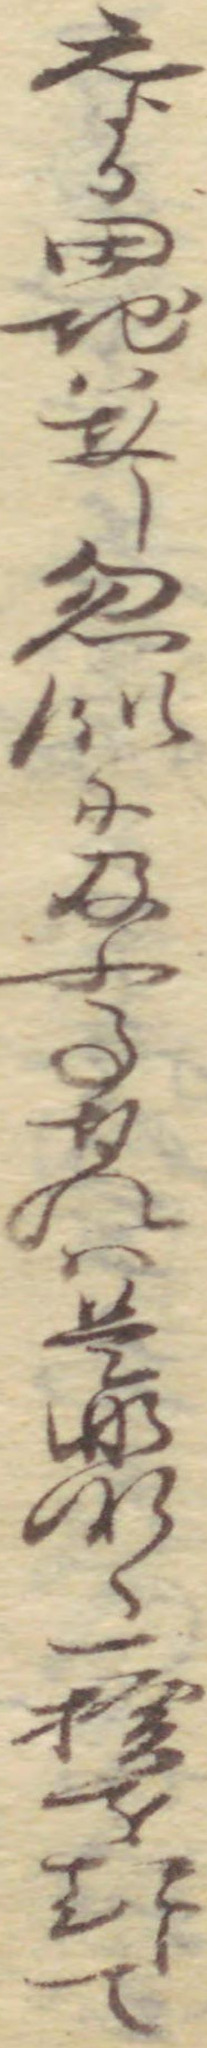元より田地はなし忽飢に及ふ事なれは是非なく一揆を起して
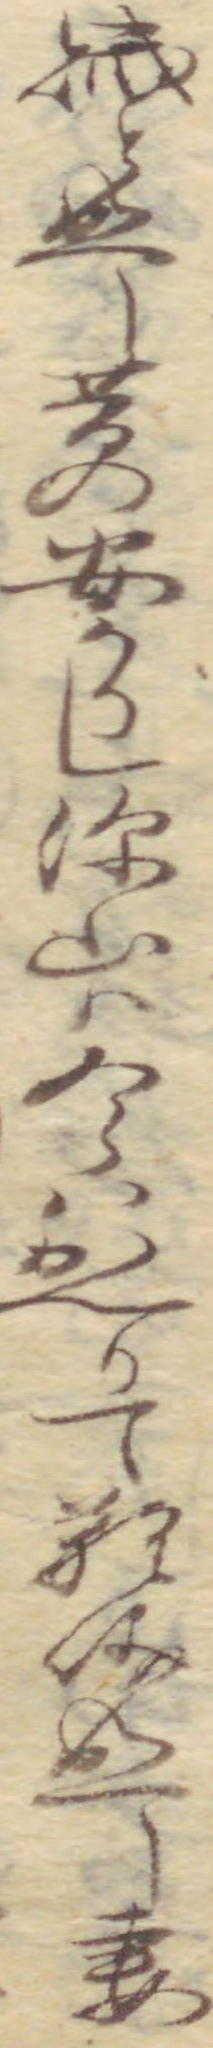賊と成へし昔の安かりし深山は今はかへりて難儀成へし妻
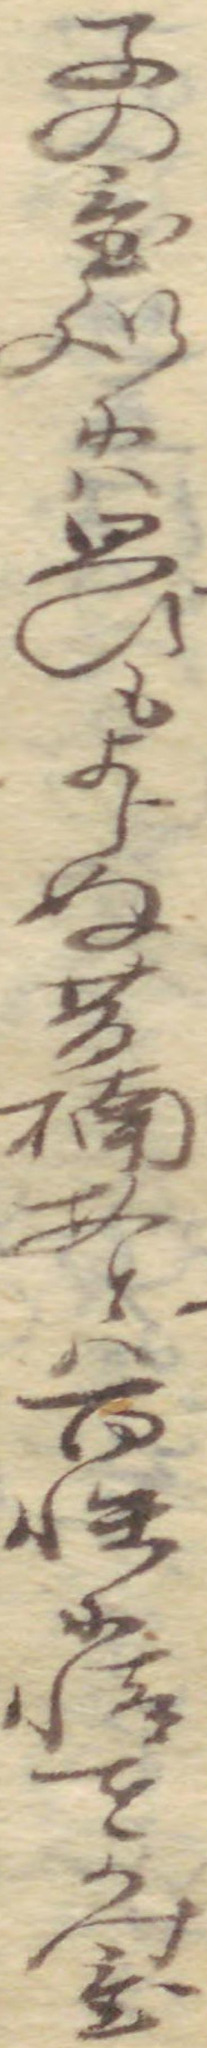子の置処には思ひもよらぬ昔楠なとは百姓に情をかけ置
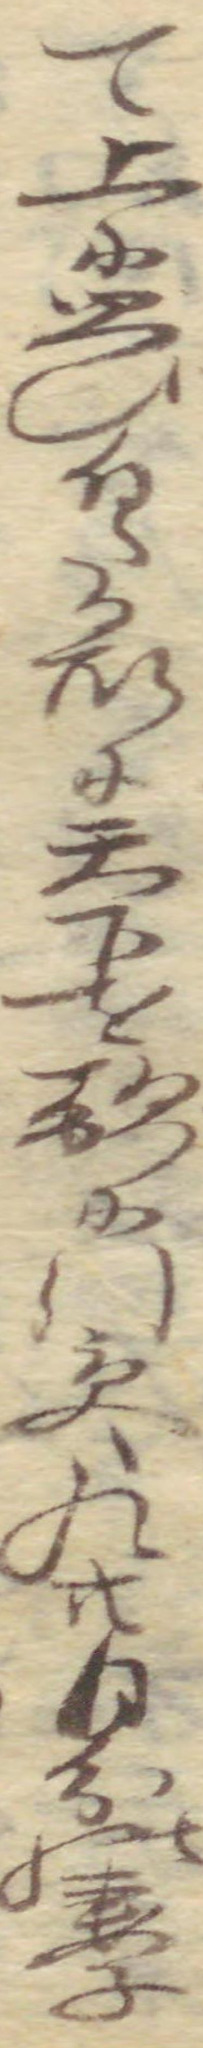て上に思ひ付たる故に天下を敵に引受たれ共自分の妻子
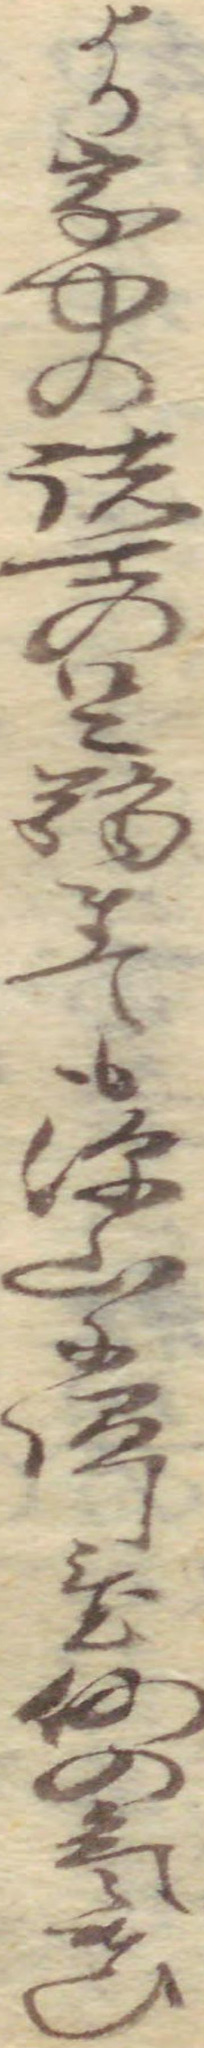より家中の諸士の足弱まても深山に隠し置何の気遣ひ
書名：鶯宿雑記. 巻263-264
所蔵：国立国会図書館 National Diet Library, JAPAN
